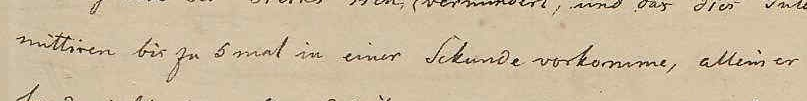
mittiren bis zu 5 mal in einer Sekunde vorkomme, allein er
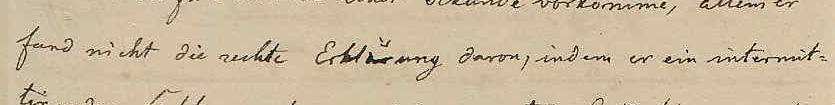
fand nicht die rechte Erklärung davon, indem er ein intermit-
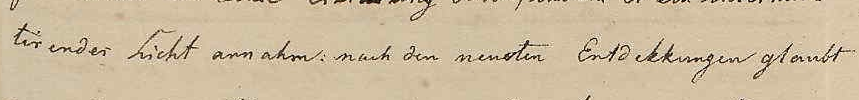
tirendes Licht annahm: nach den neusten Entdekkungen glaubt
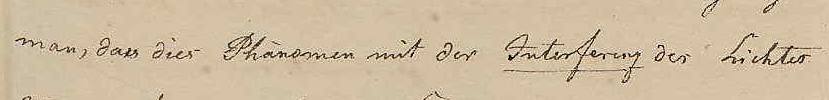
man, dass dies Phänomen mit der Interferenz des Lichtes
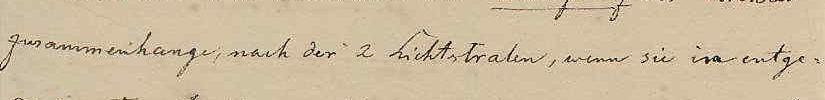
zusammenhange, nach der 2 Lichtstralen, wenn sie in entge-
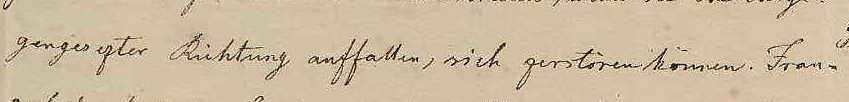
gengesezter Richtung auffallen, sich zerstören können. Frau-
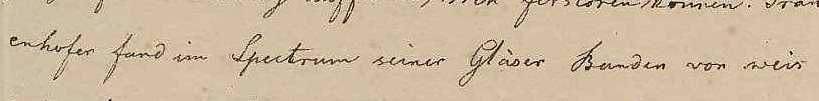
enhofer fand im Spectrum seiner Gläser Banden von weis
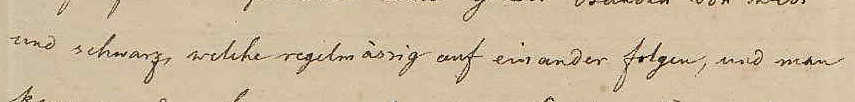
und schwarz, welche regelmässig auf einander folgen, und man
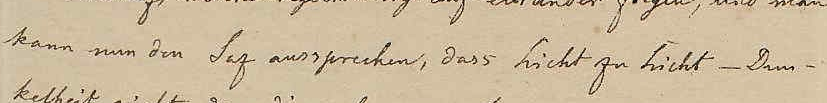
kann nun den Saz aussprechen, dass Licht zu Licht – Dun-
